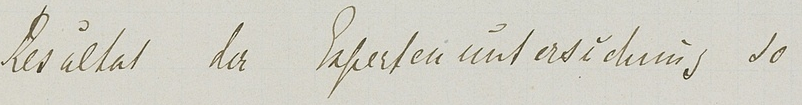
Resultat der Expertenuntersuchung so
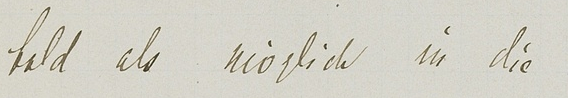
bald als möglich in die
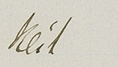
keit
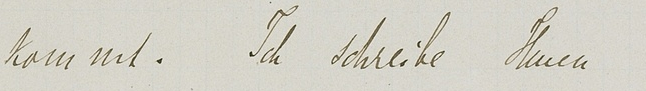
kommt. Ich schreibe Ihnen
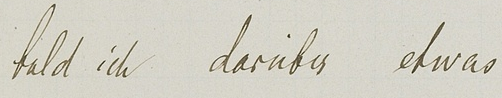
bald ich darüber etwas
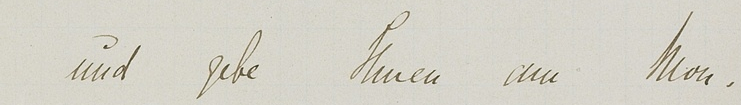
und gebe Ihnen am Mon-
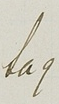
tag
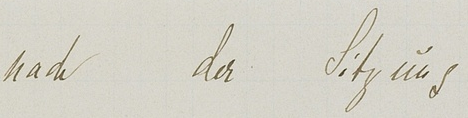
nach der Sitzung
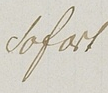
sofort
